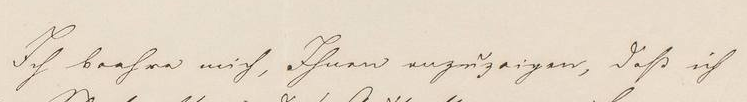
Ich beehre mich, Ihnen anzuzeigen, daß ich
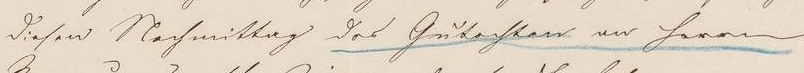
diesen Nachmittag das Gutachten an Herrn
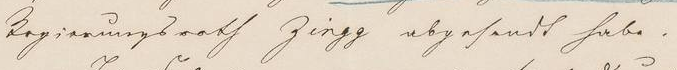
Regierungsrath Zingg abgesandt habe.
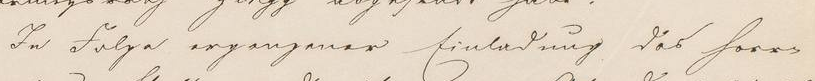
In Folge ergangener Einladung des Herrn
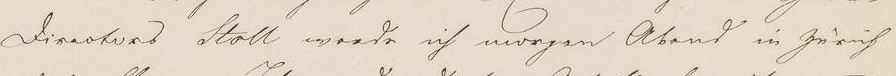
Direktor Stoll werde ich morgen Abend in Zürich
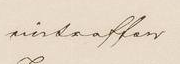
eintreffen.
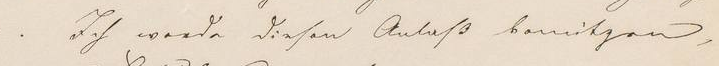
Ich werde diesen Anlaß benützen,
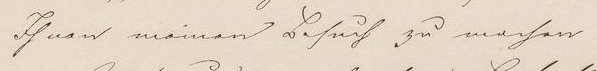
Ihnen meinen Besuch zu machen.
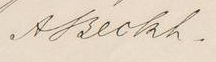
A Beckh.
